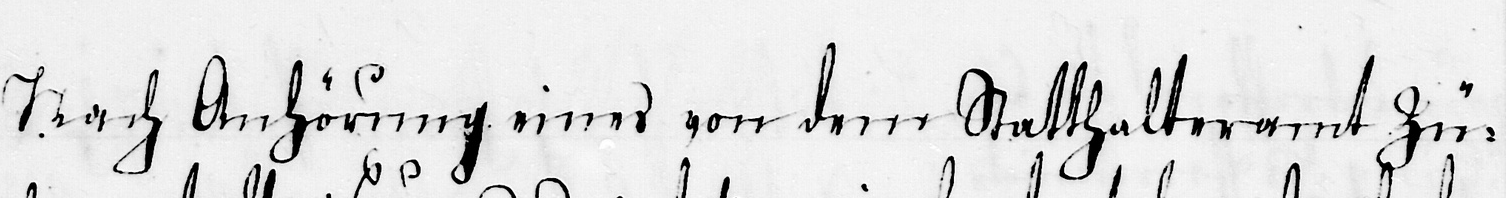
Nach Anhörung eines von dem Statthalteramt Zür¬
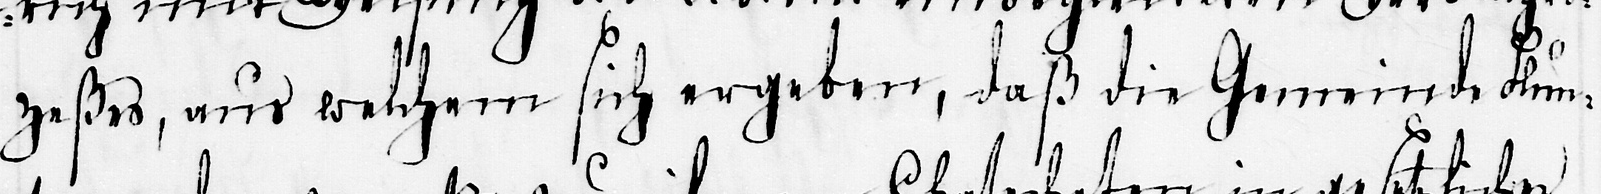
zeßes, aus welchem sich ergeben, daß die Gemeinde Flun¬
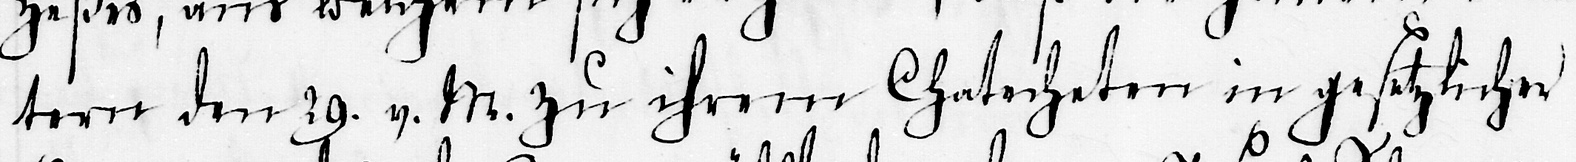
tern den 29. v. M. zu ihrem Chatecheten in gesetzlicher
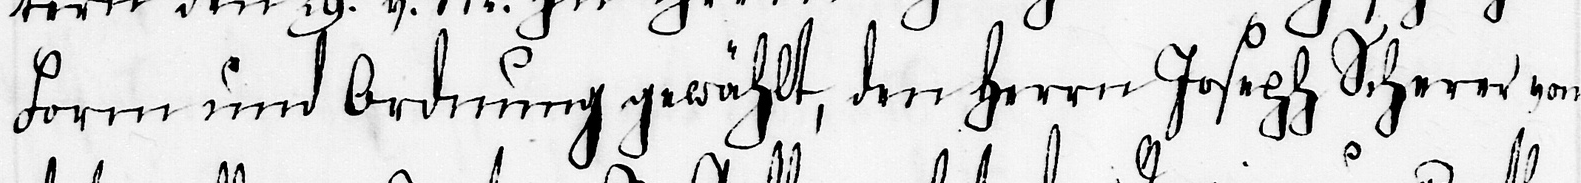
Form und Ordnung gewählt, den Herrn Joseph Scherer von
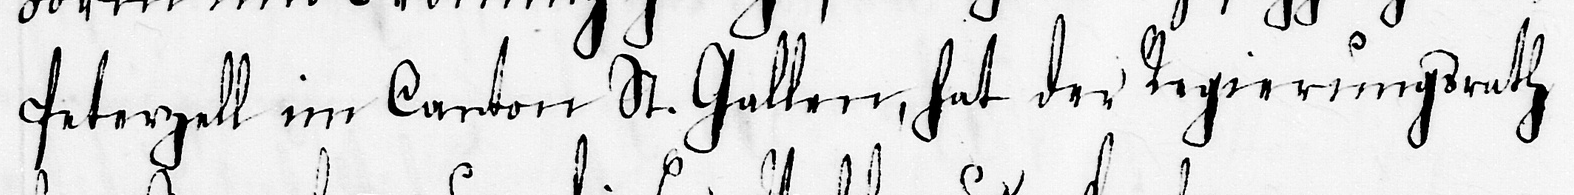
Peterzell im Canton St. Gallen, hat der Regierungsrath
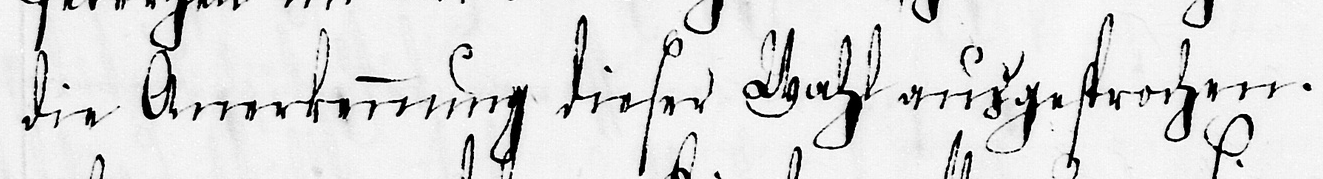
die Anerkennung dieser Wahl ausgesprochen.
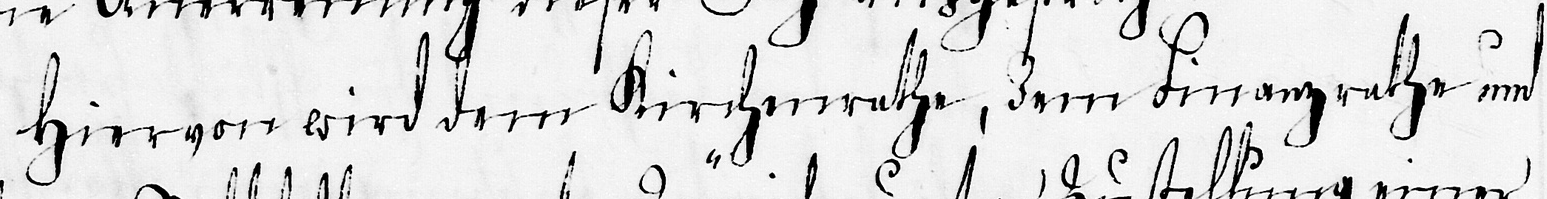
Hiervon wird dem Kirchenrathe, dem Finanzrathe und
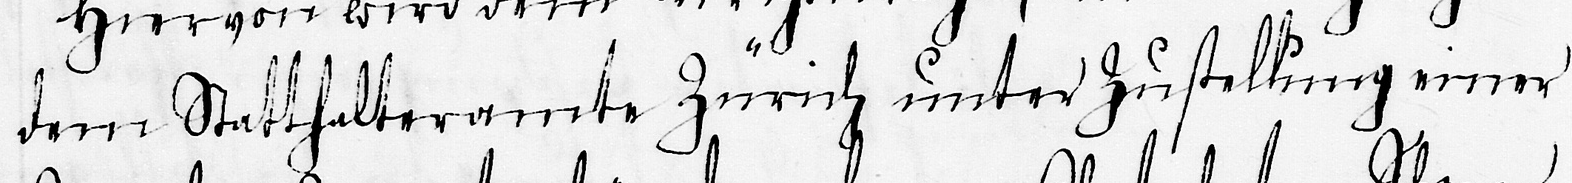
dem Statthalteramte Zürich unter Zustellung einer
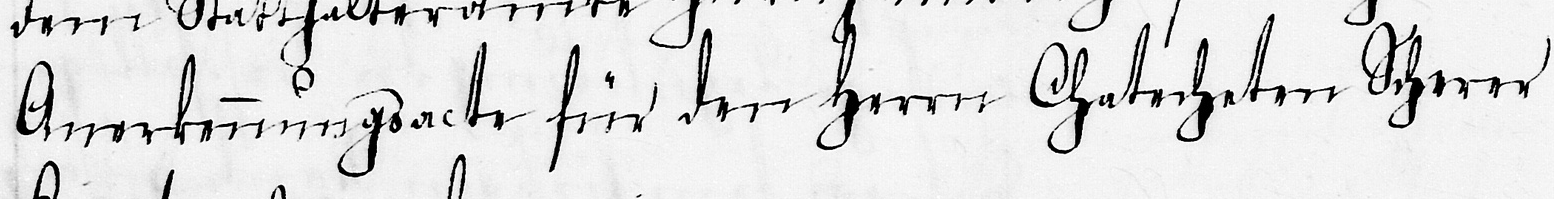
Anerkennungsacte für den Herrn Chatecheten Scherer
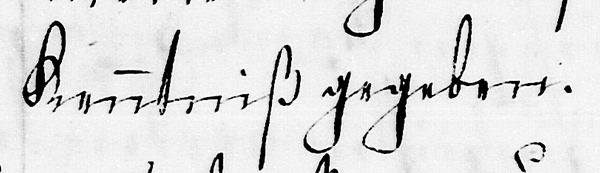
Kenntniß gegeben.
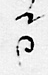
d.
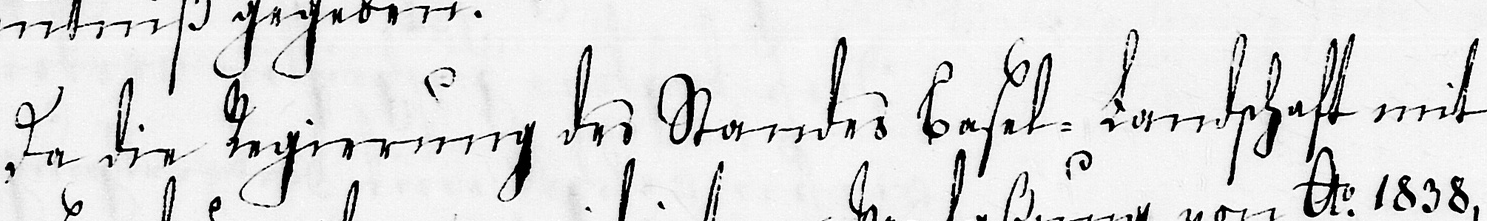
Da die Regierung des Standes Basel-Landschaft mit
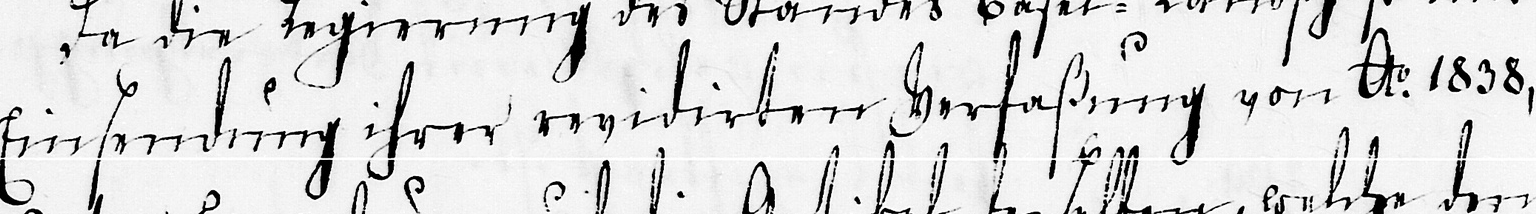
Einsendung ihrer revidirten Verfaßung von Ao. 1838,
